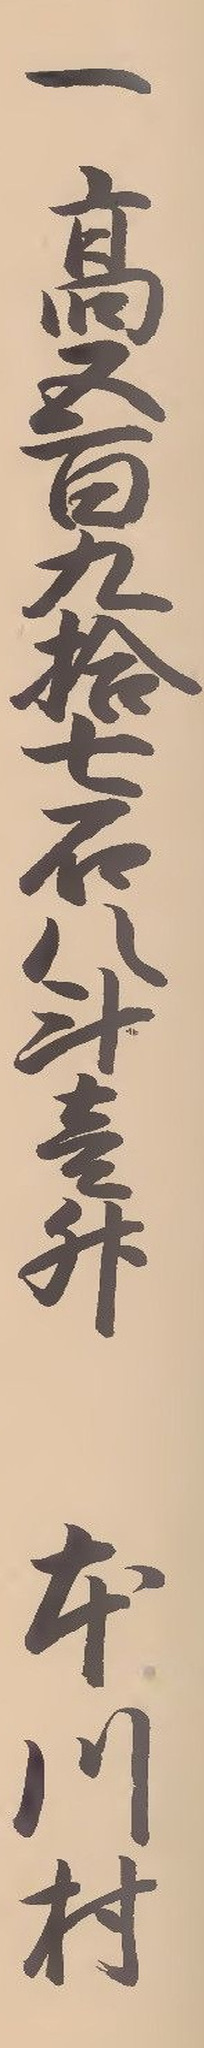一高五百九拾七石八斗壱升本川村
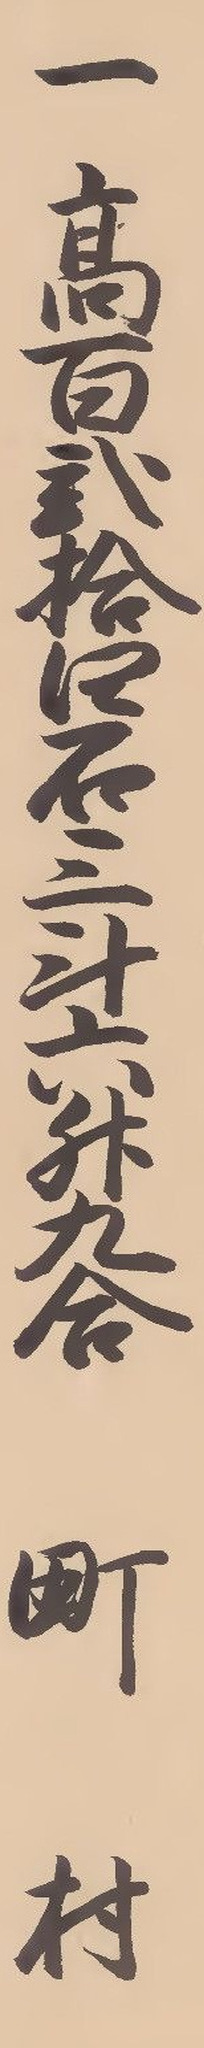一高百弐拾四石三斗六升九合町村
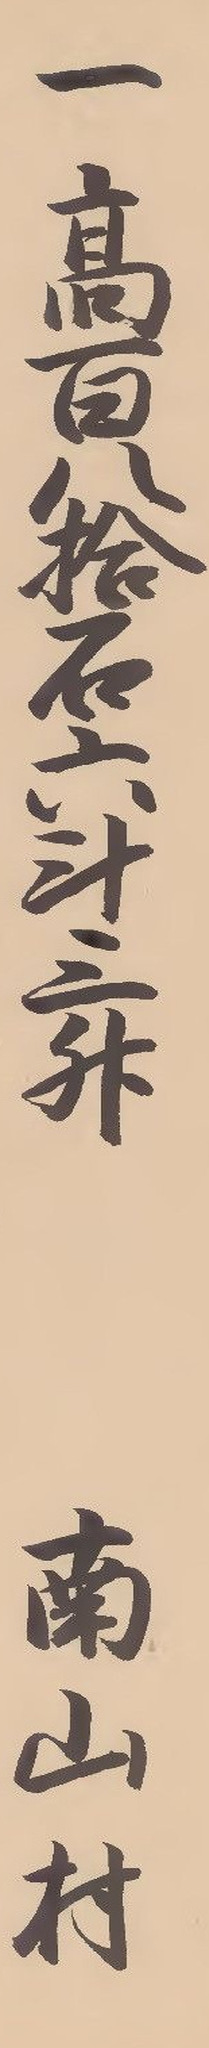一高百八拾石六斗三升南山村
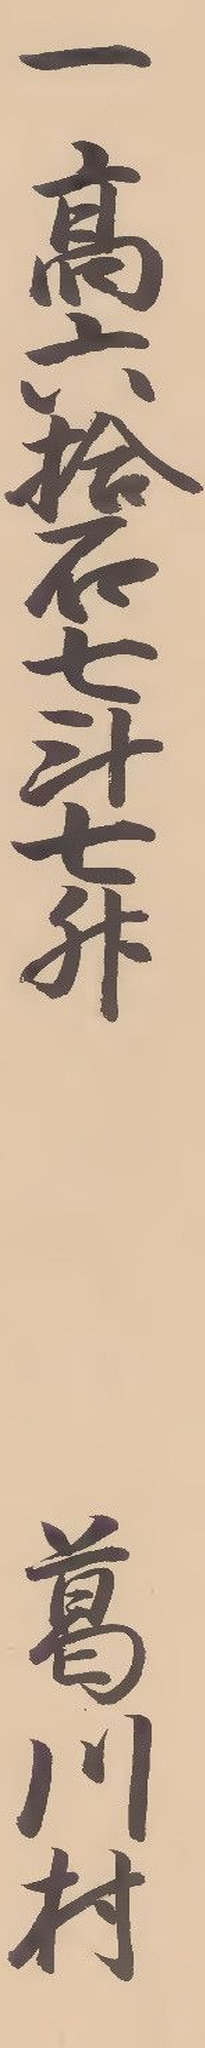一高六拾石七斗七升葛川村

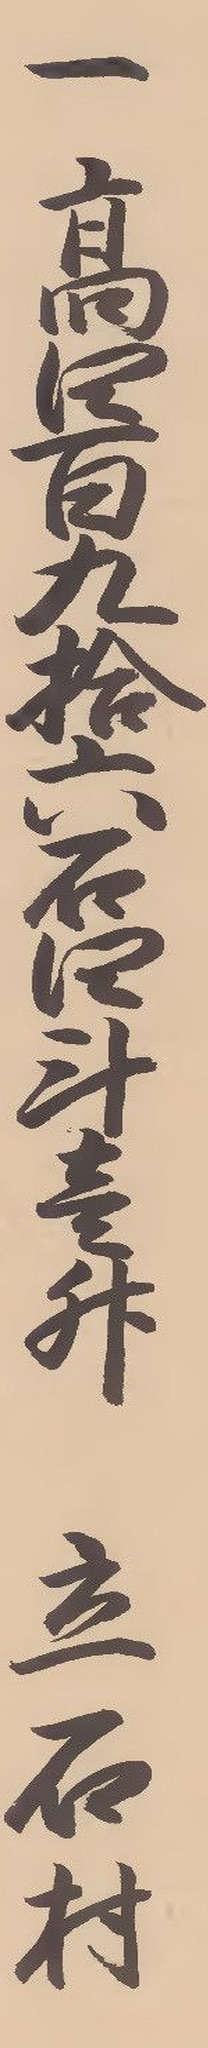一高四百九拾六石四斗壱升立石村
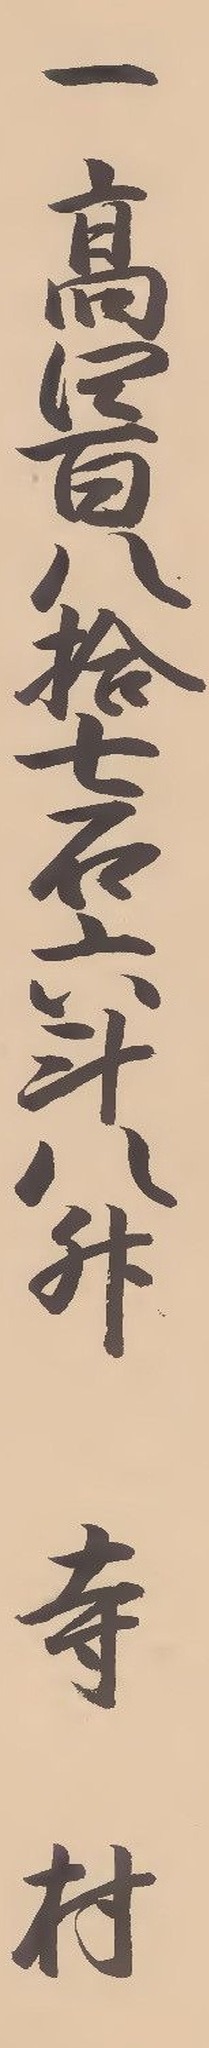一高四百八拾七石六斗八升寺村
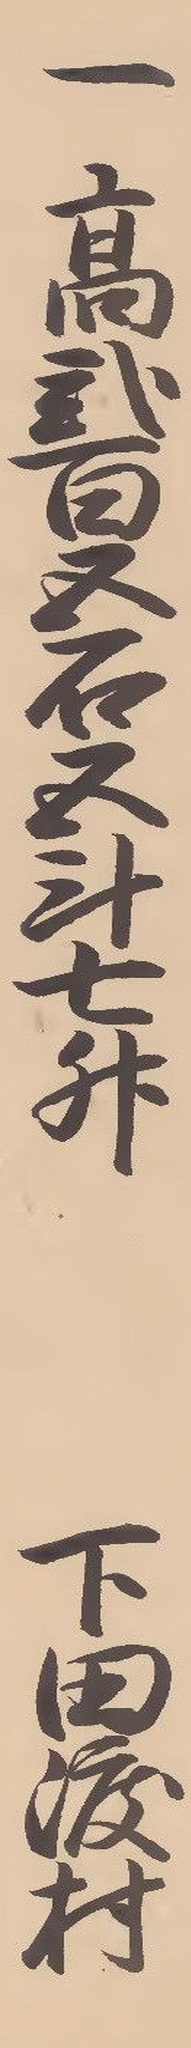一高弐百五石五斗七升下田渡村
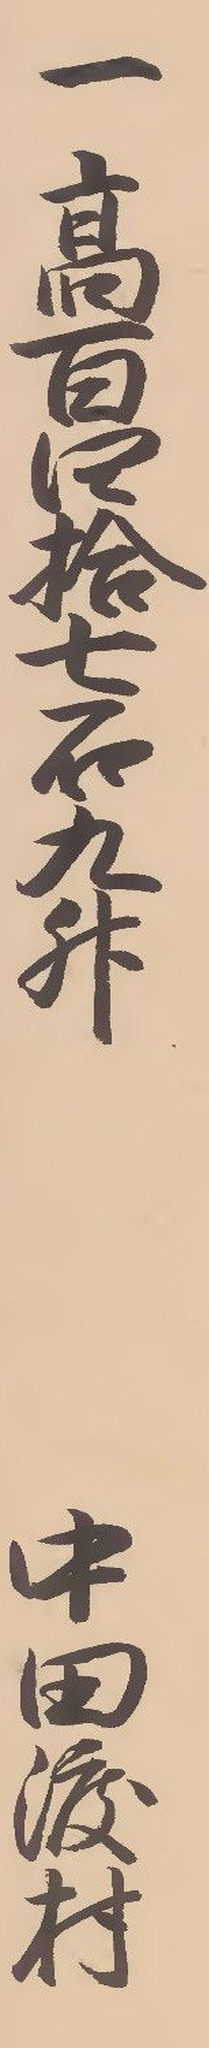一高百四拾七石九升中田渡村
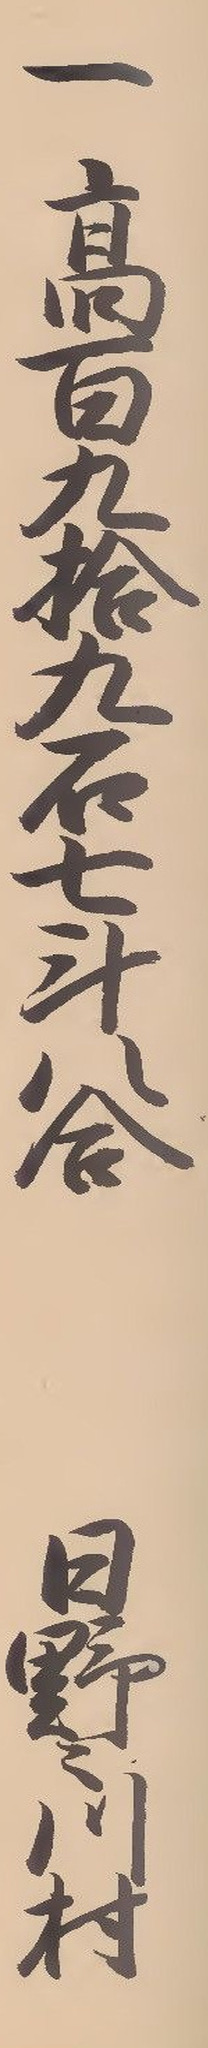一高百九拾九石七斗八合日野々川村
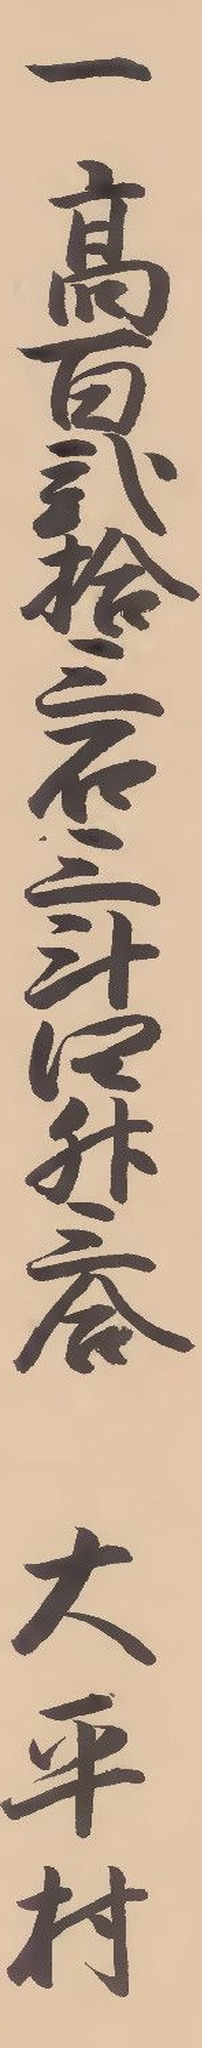一高百弐拾三石三斗四升三合大平村
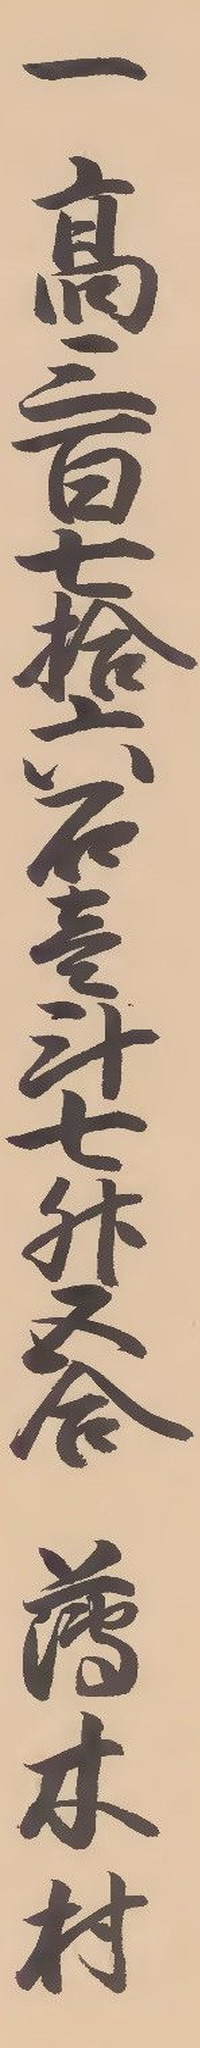一高三百七拾六石壱斗七升五合薄木村

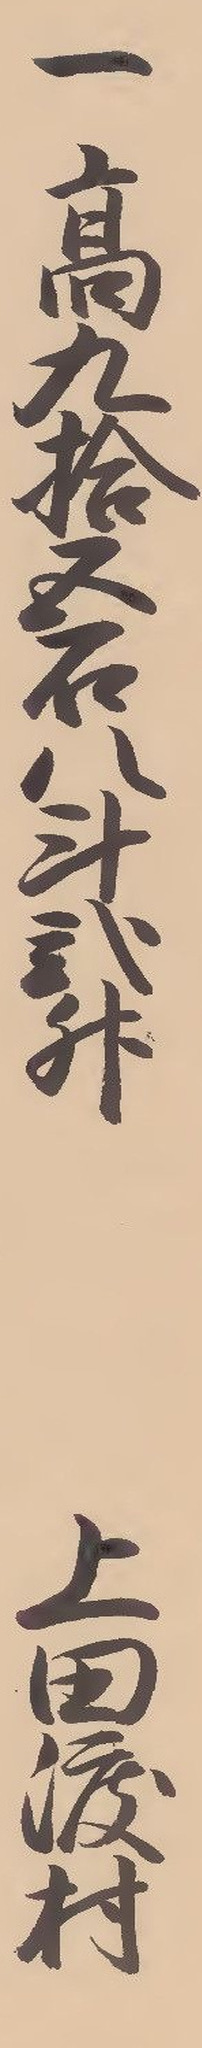一高九拾五石八斗弐升上田渡村
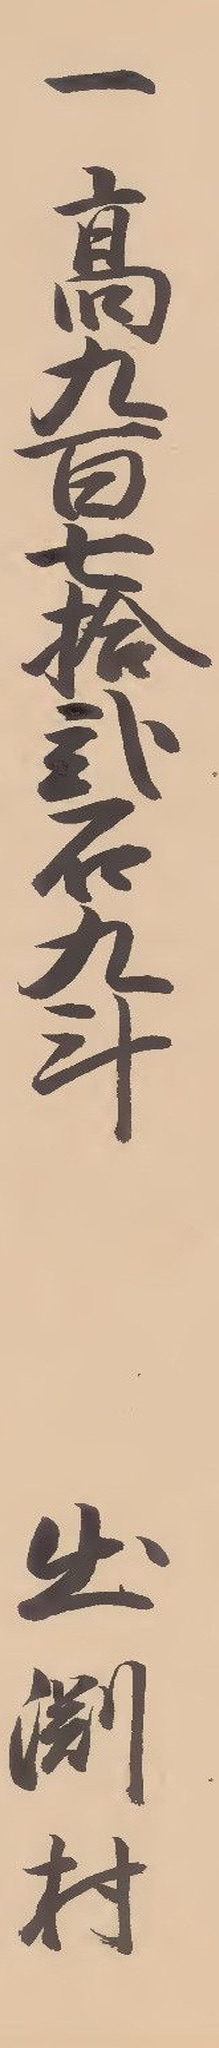一高九百七拾弐石九斗出淵村
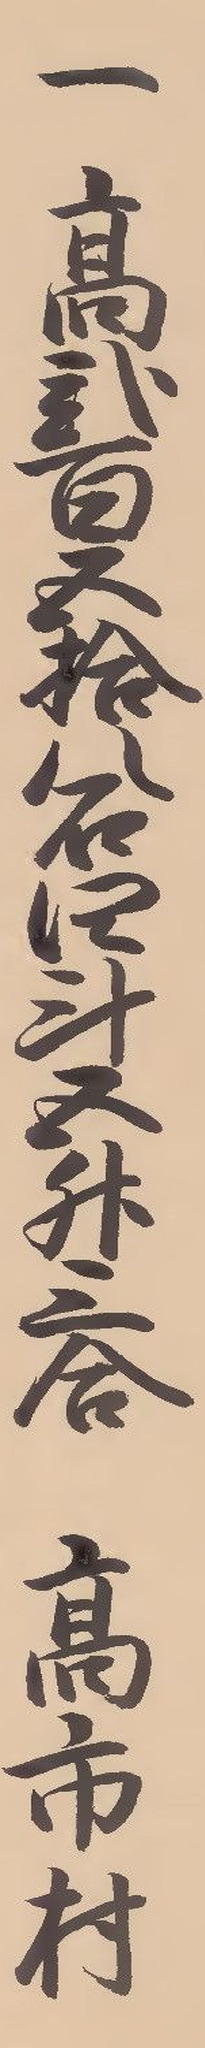一高弐百五拾八石四斗五升三合高市村
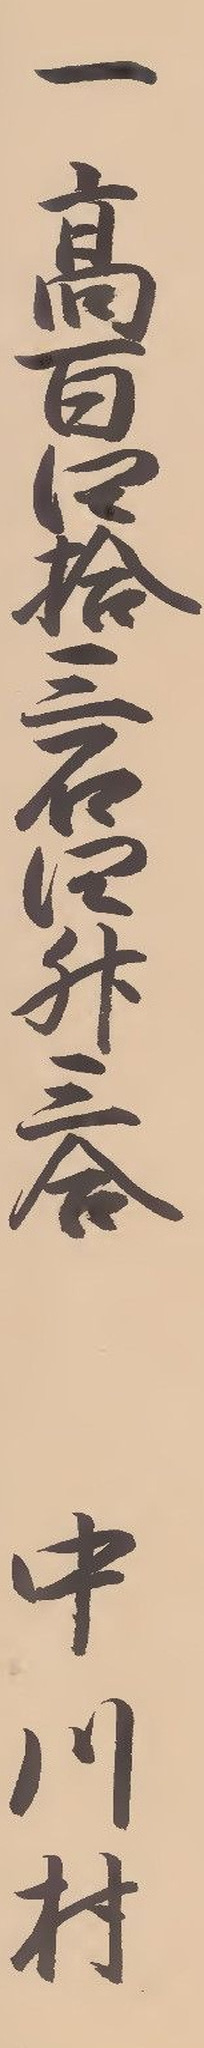一高百四拾三石四升三合中川村
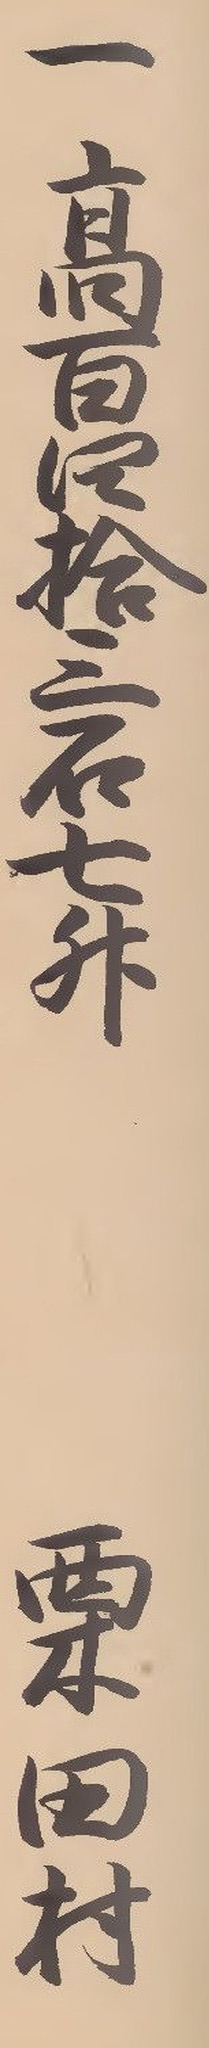一高百四拾三石七升栗田村
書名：伊予国郷帳
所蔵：国立公文書館 National Archives of Japan
